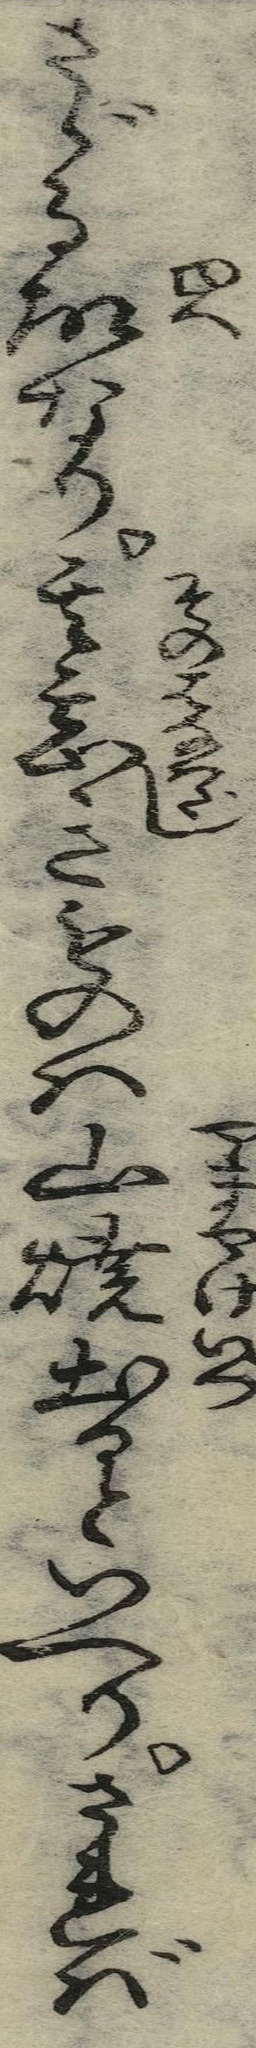さゞる故なり。其甚きものは山焼出るといへり。されば
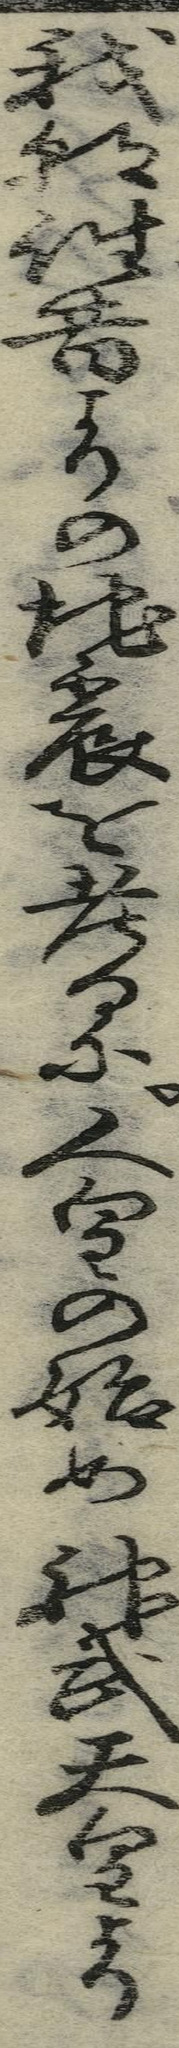我朝往昔よりの地震を考るに。人皇の始め神武天皇より
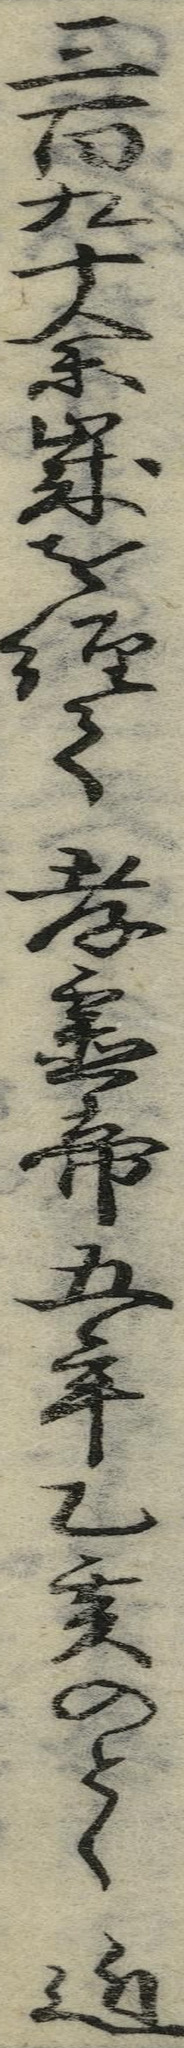三百九十余歳を経て孝霊帝五年乙亥のとし近
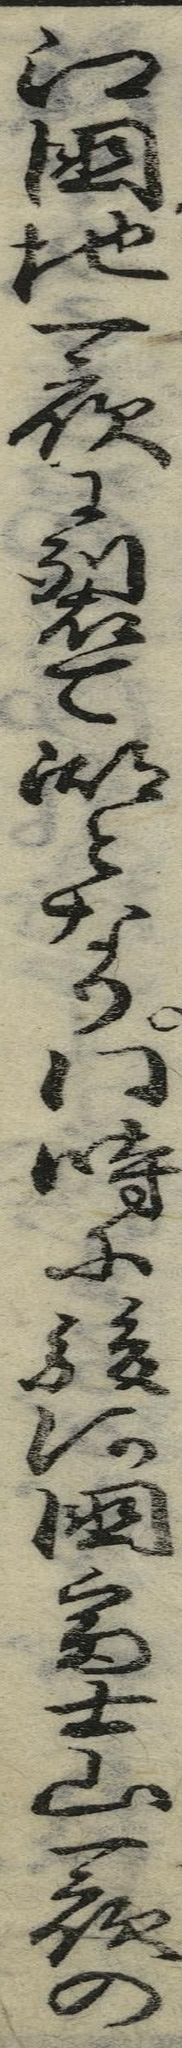江国地一夜に裂て湖となり。同時に駿河国富士山一夜の
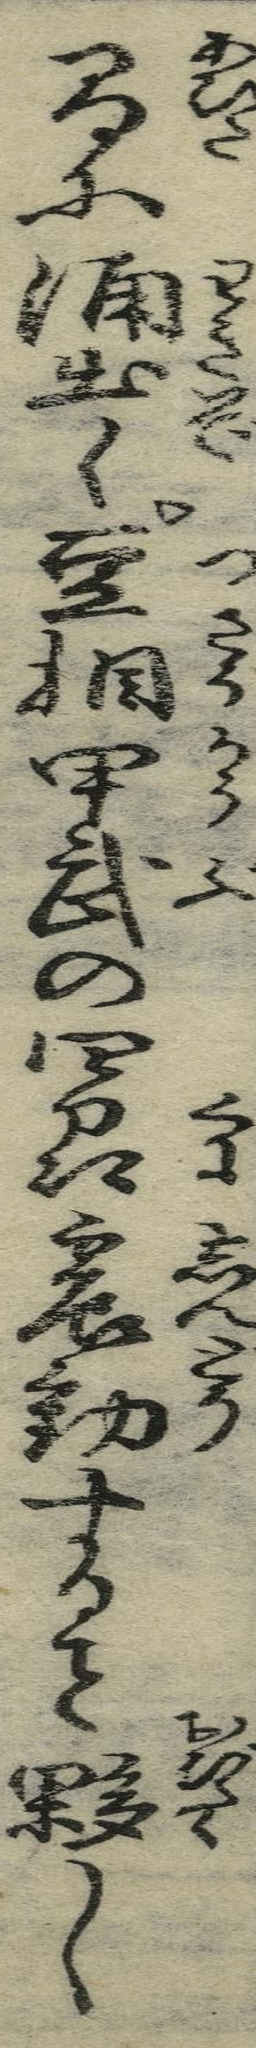間に涌出し。豆相甲武の四州震動すること夥し
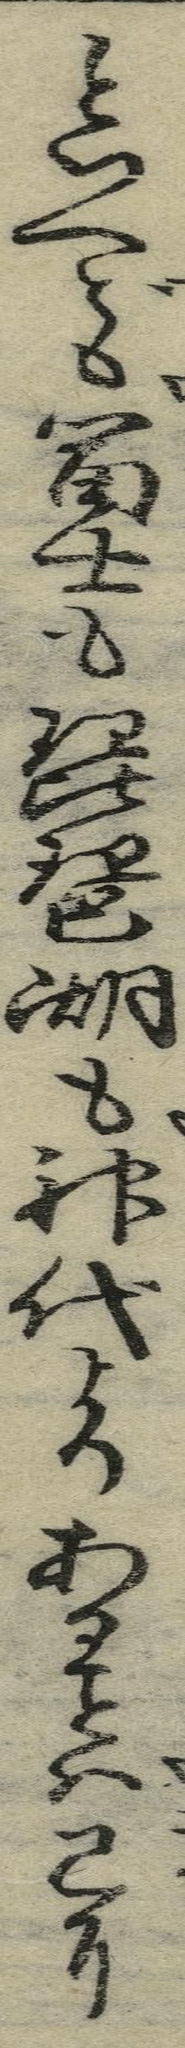といへども。富士も琵琶湖も。神代よりありとは。已に
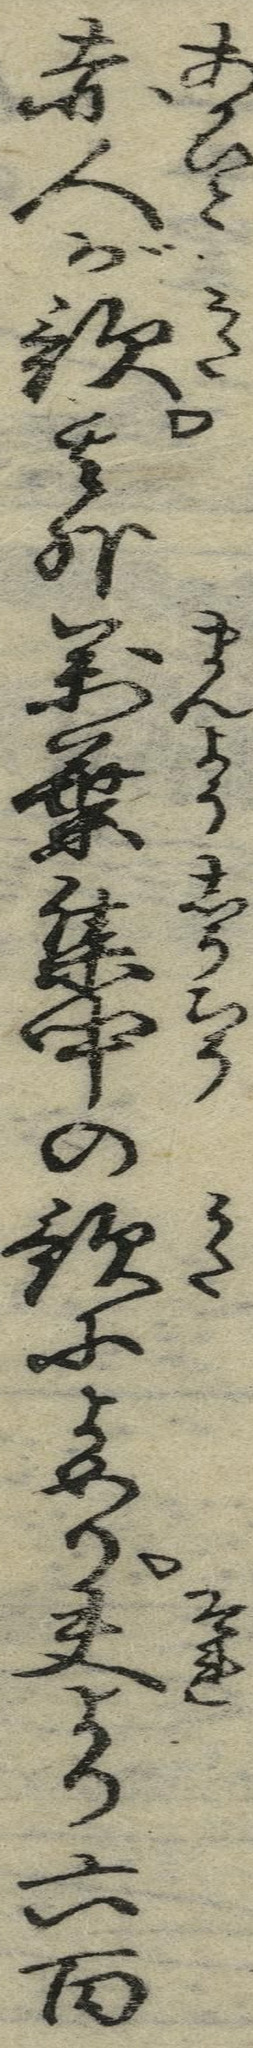赤人が歌。其外万葉集中の歌によめり。夫より六百
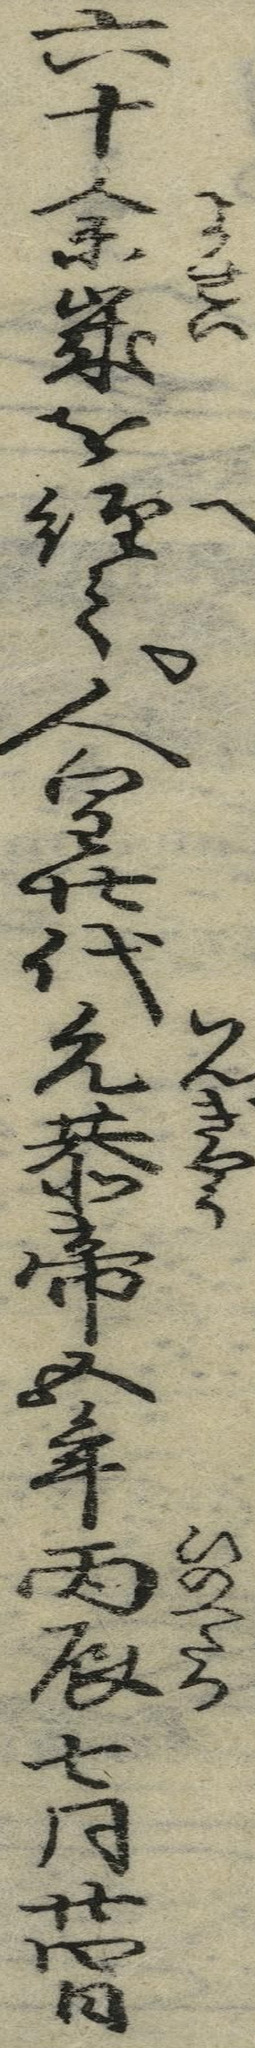六十余歳を経て。人皇廿代允恭帝五年丙辰七月廿四日
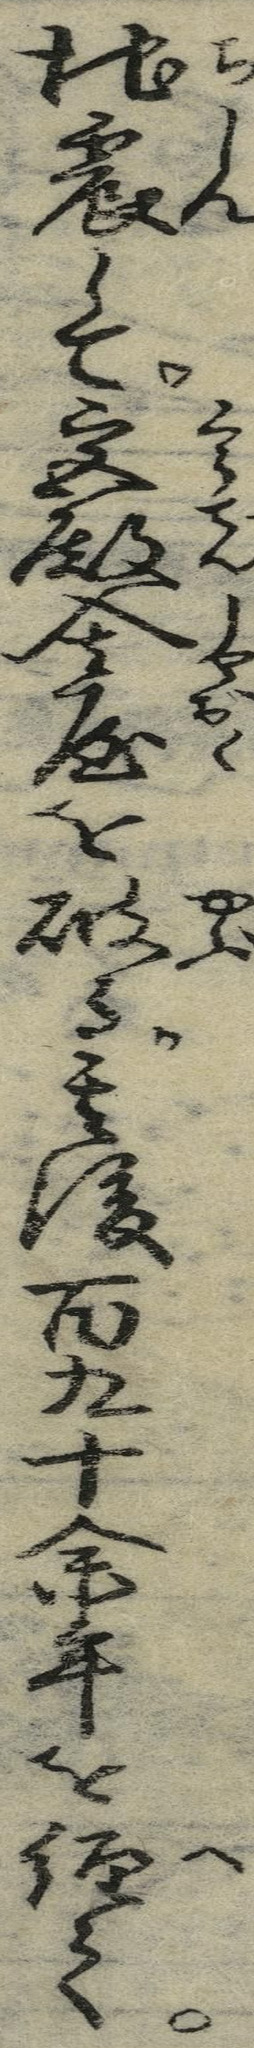地震して。宮殿舎屋を破る。其後百九十余年を経て。
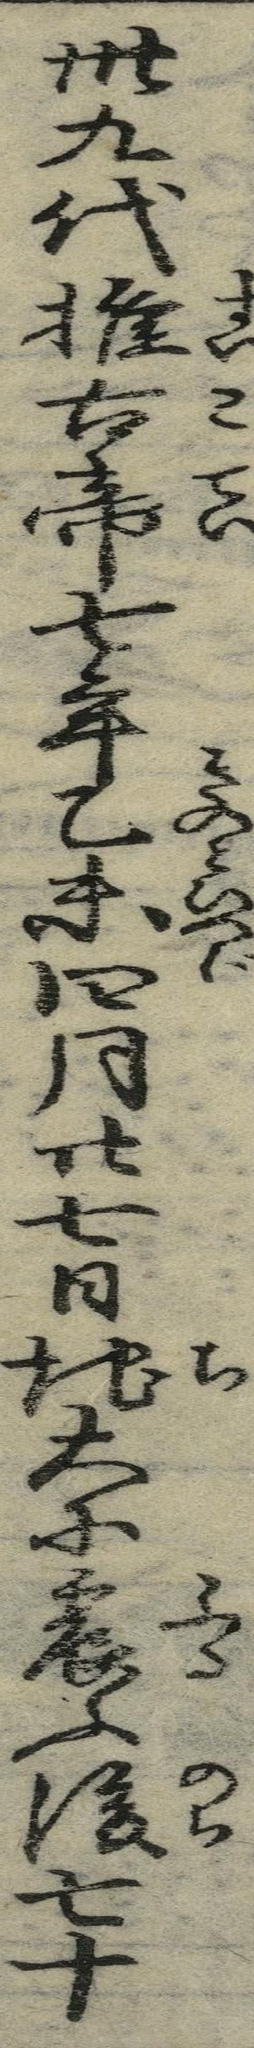丗九代推古帝七年乙未四月廿七日地大に震ふ後七十
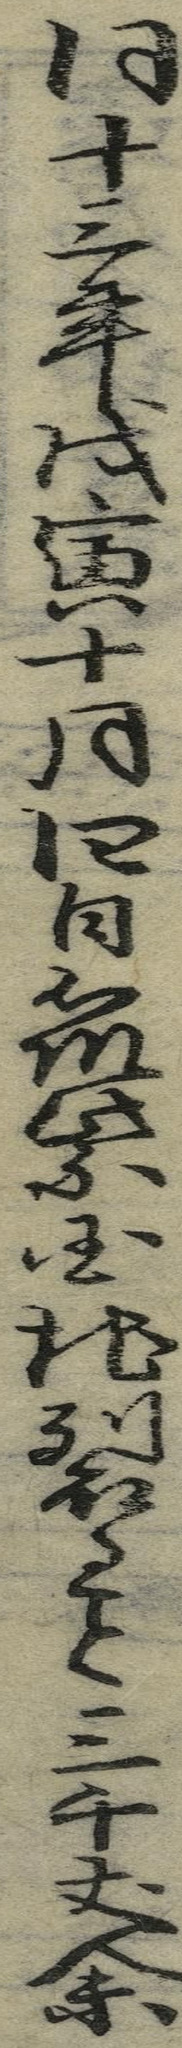同十三年戊寅十月四日筑紫国地裂ること三千丈余

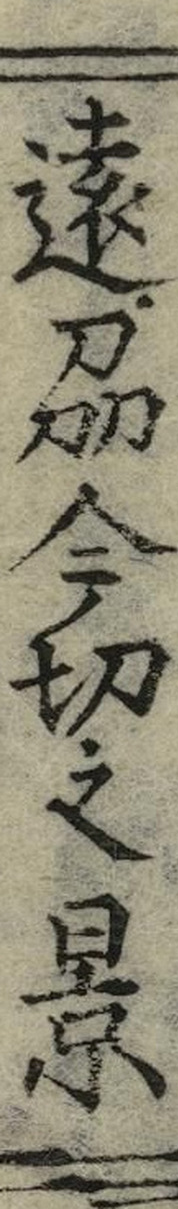遠州今切之景
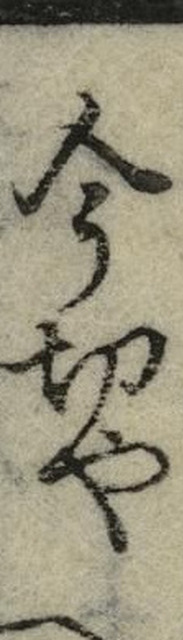今切や
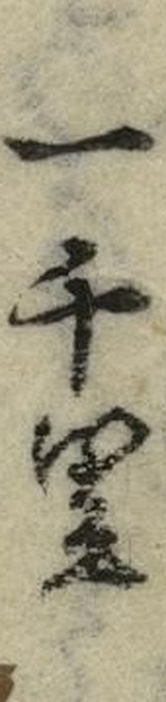一千里
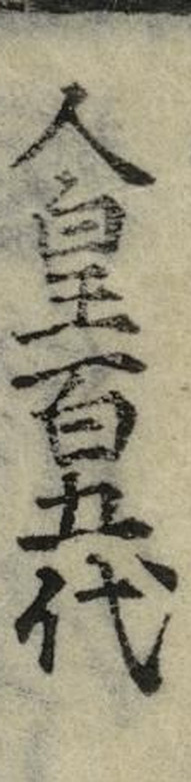人皇百五代
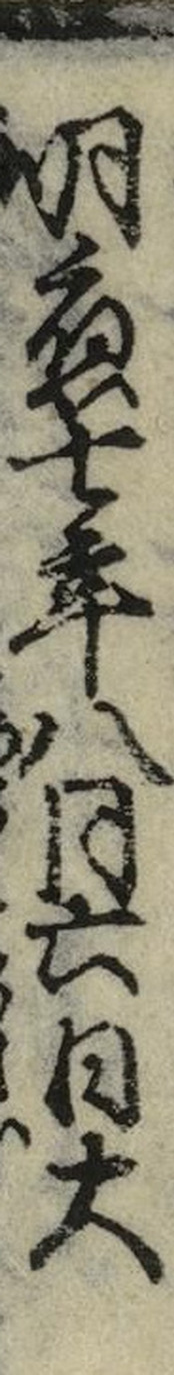明応七年八月六日大
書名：本朝地震記　全
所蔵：東京大学地震研究所図書室 Earthquake Research Institute Library, The University of Tokyo, JAPAN
